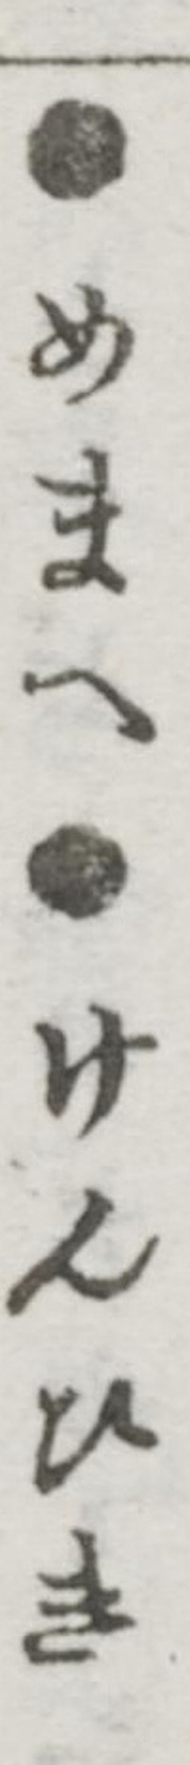●めまへ●けんひき
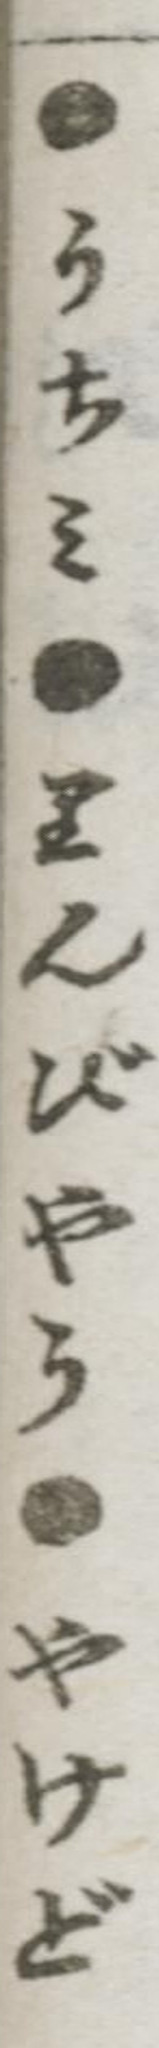●うちみ●りんびやう●やけど
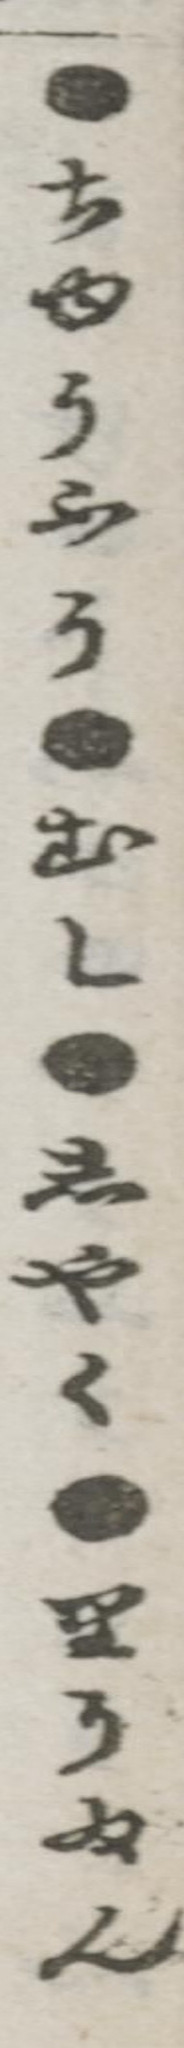同貉湯●ちゆうふう●むし●しやく●りうゐん
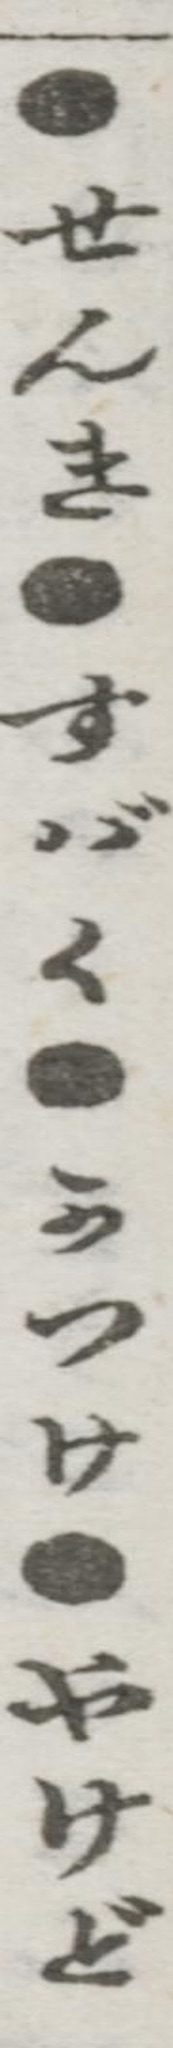●せんき●すばく●かつけ●やけど
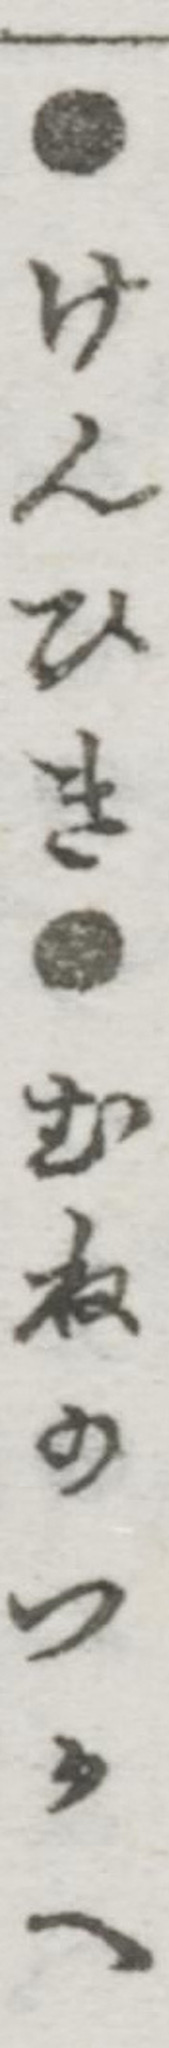●けんひき●むねのつかへ
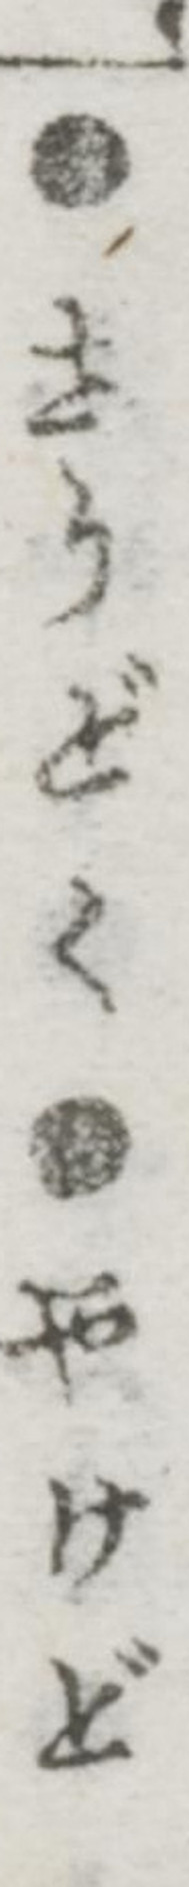●さうどく●やけど
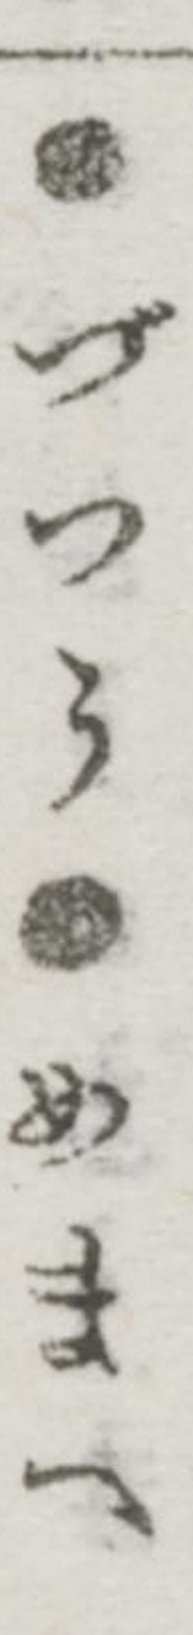●づつう●めまへ
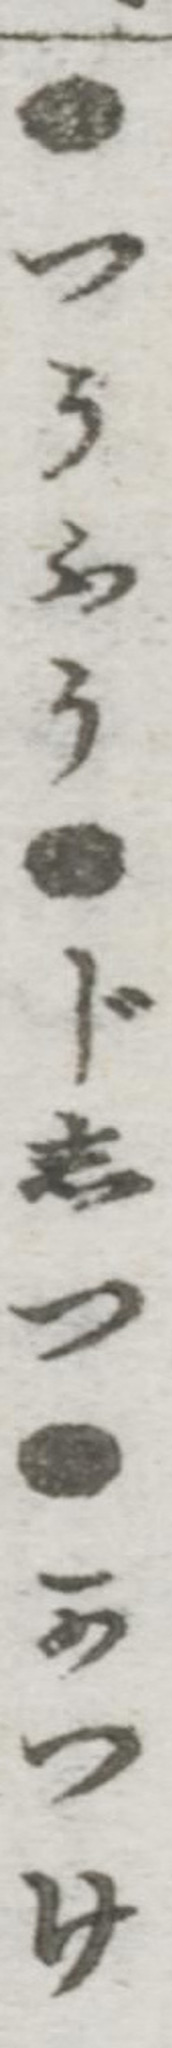●つうふう●じしつ●かつけ
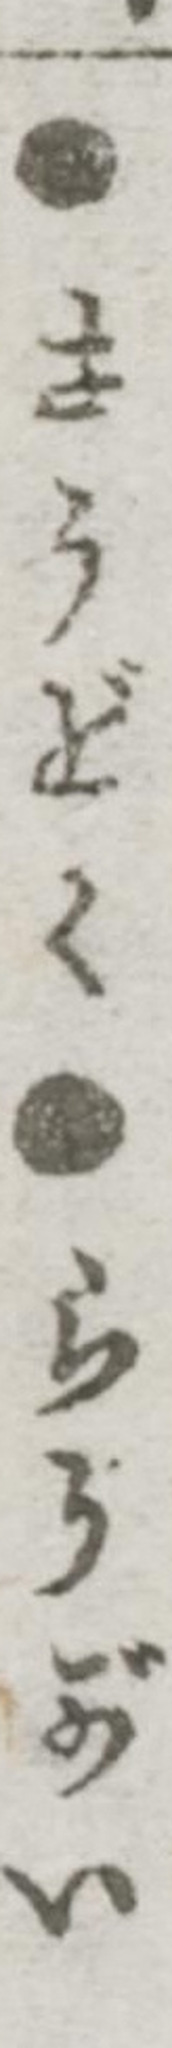●さうどく●らうがい

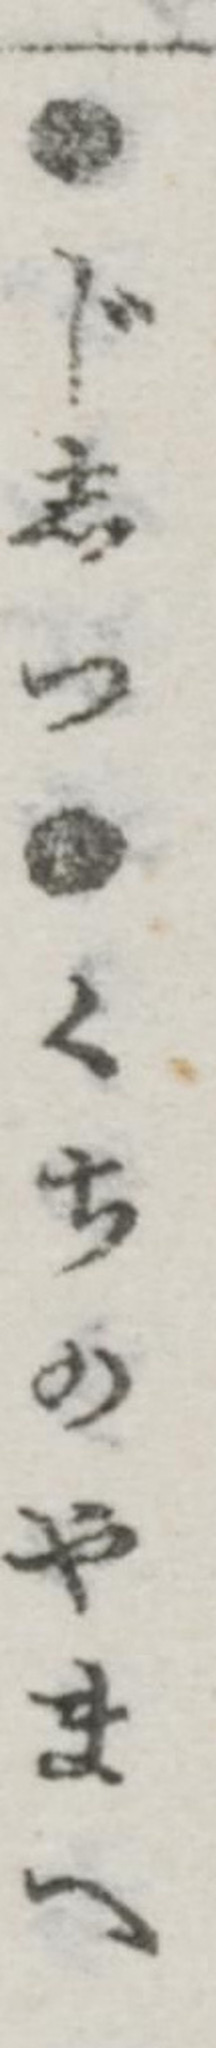●じしつ●くちのやまへ
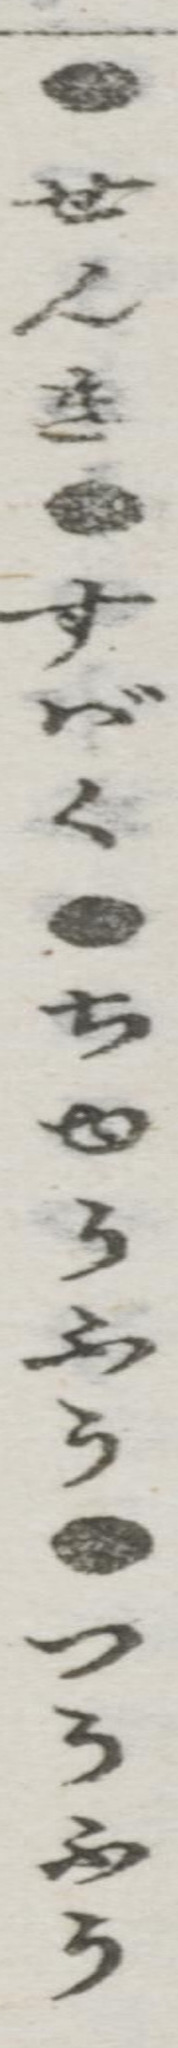同中湯●せんき●すばく●ちゆうふう●つうふう
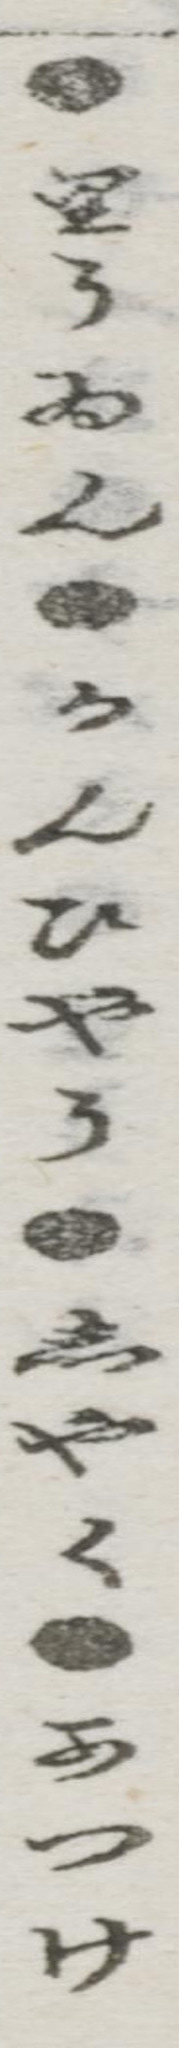●りうゐん●かんひやう●しやく●かつけ
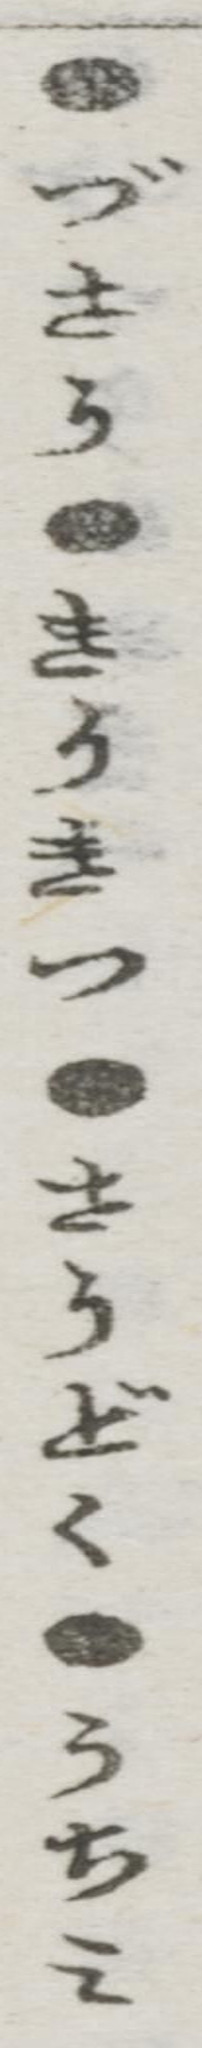同角湯●づさう●きうきつ●さうどく●うちみ
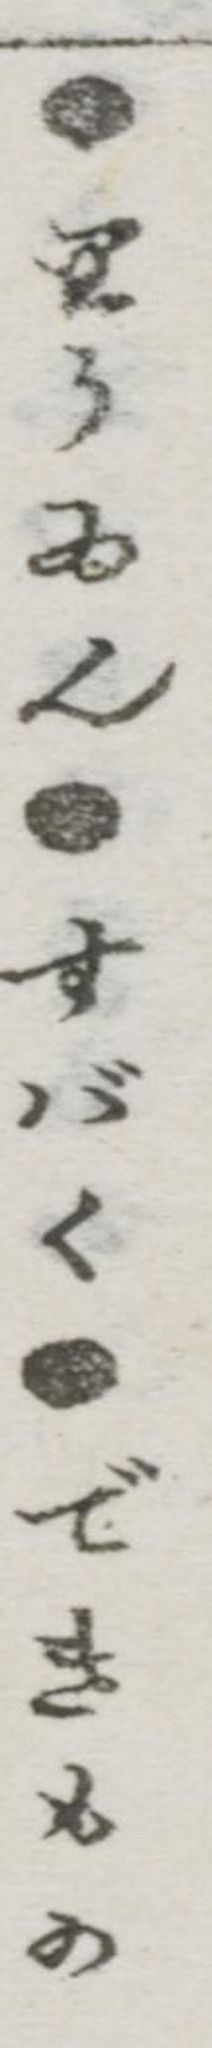●りうゐん●すばく●できもの
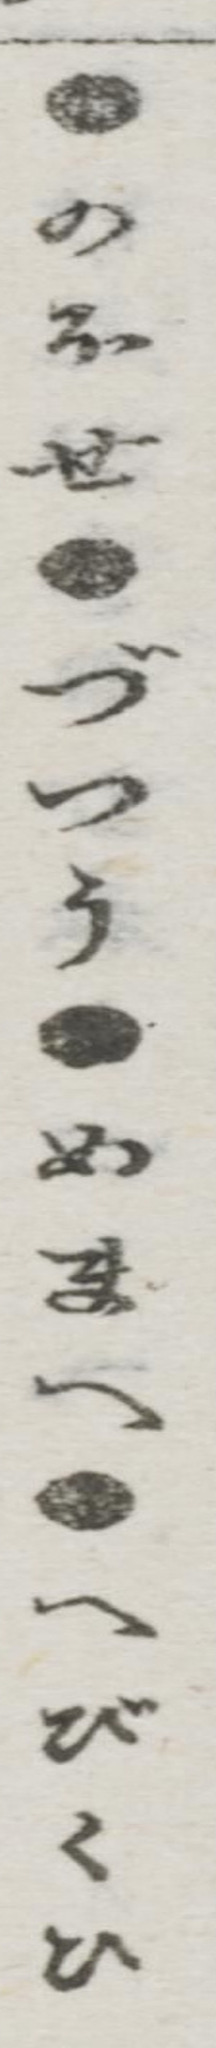同中湯●のほせ●づつう●めまへ●へびくひ
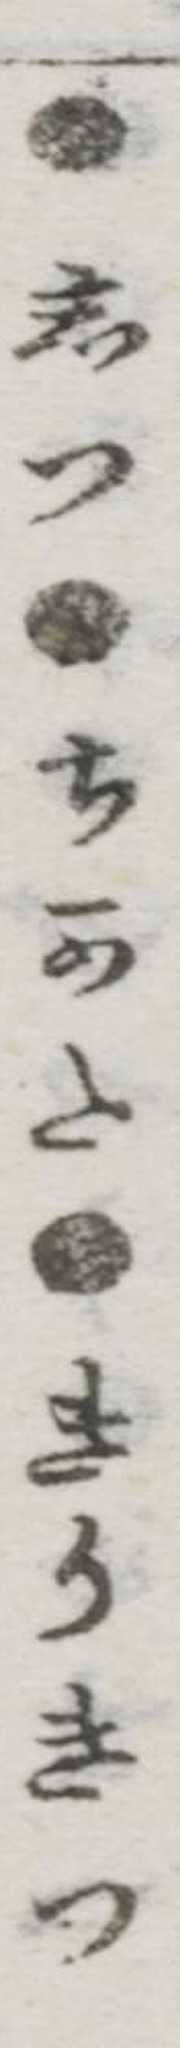●しつ●ちかた●きうきつ
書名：塩原繁昌記　全
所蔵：東京大学地震研究所図書室 Earthquake Research Institute Library, The University of Tokyo, JAPAN
